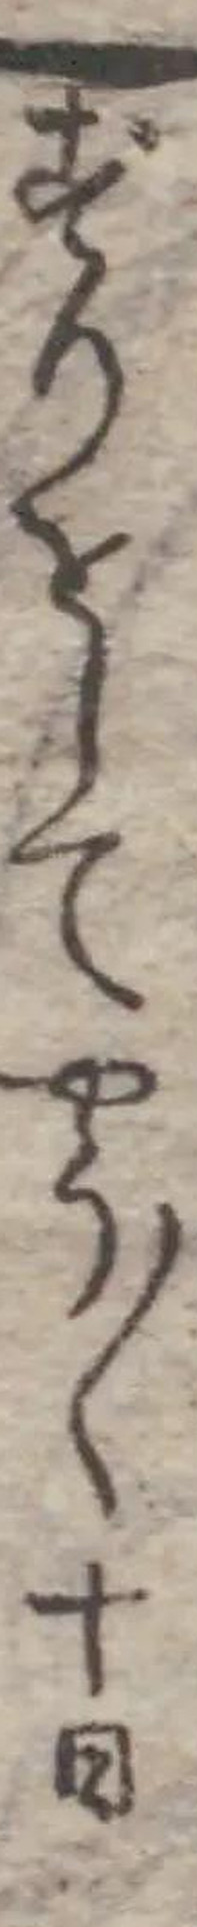ずりをしてやう〳〵十日
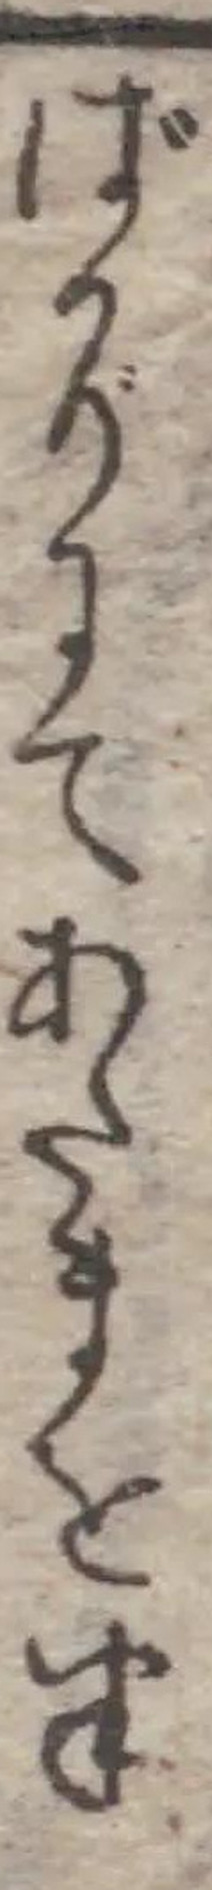ばかりにてあたまを半
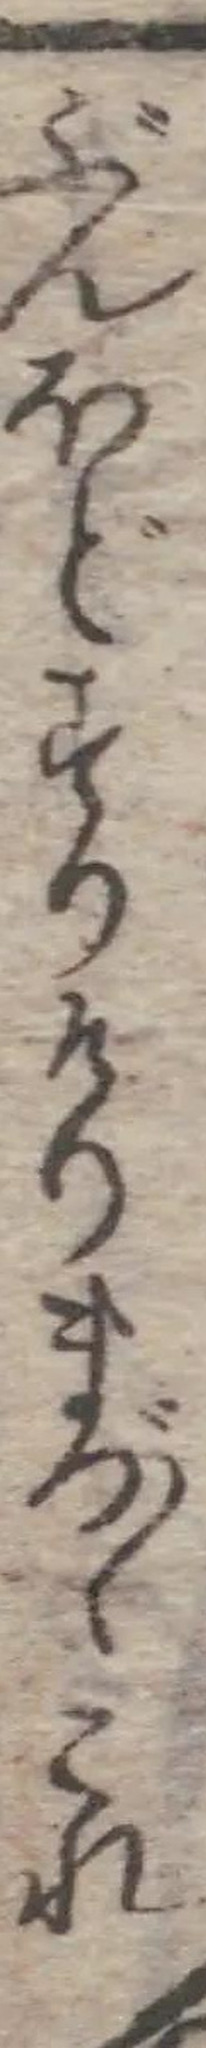ぶんほどすりけりまづ〳〵これ
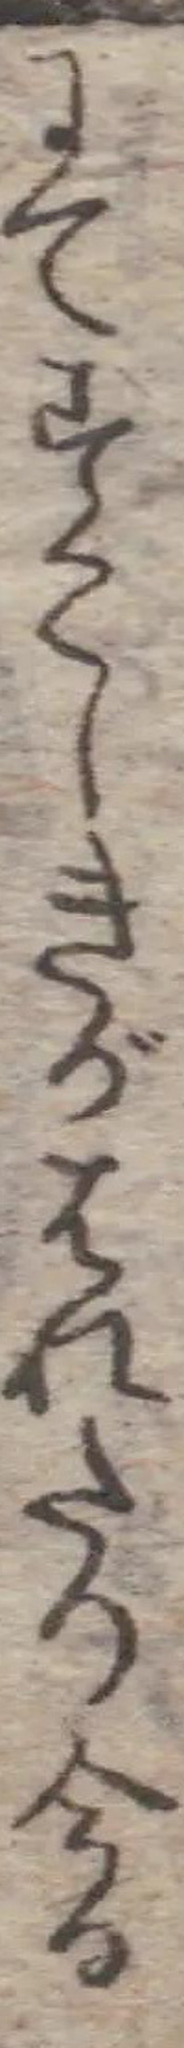にてすこしきがはれたり今日
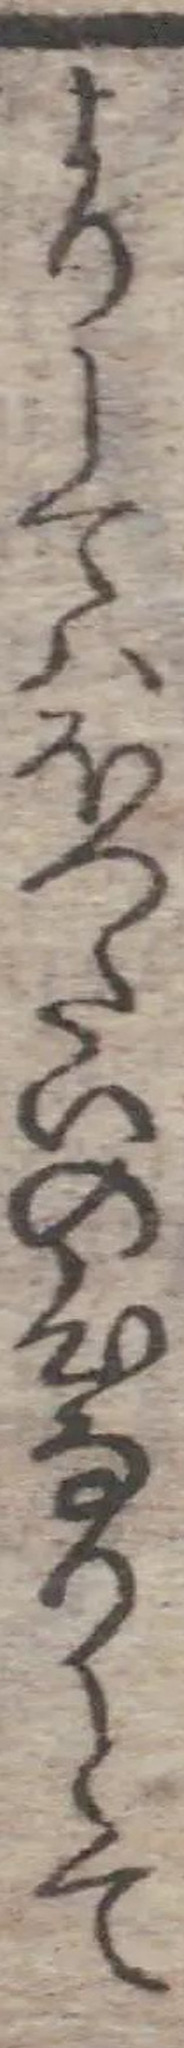よりしてはほつたいの心なりとて
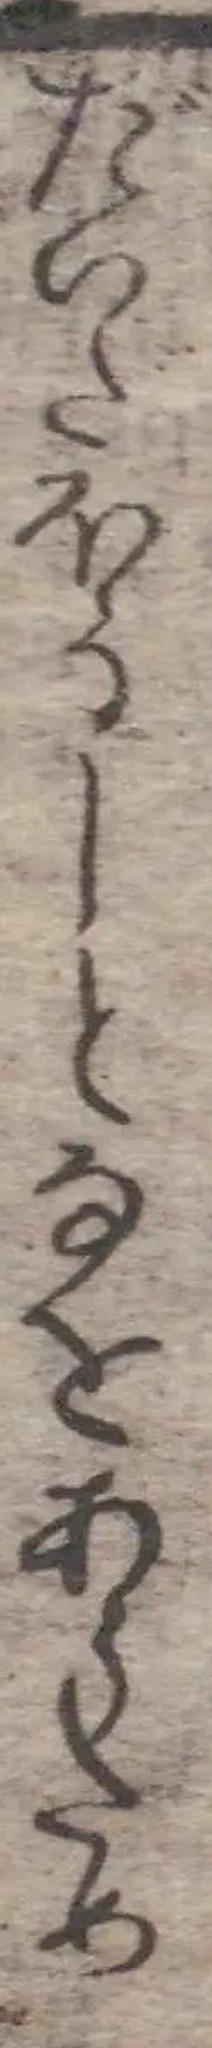だいだほうしとなをあらため
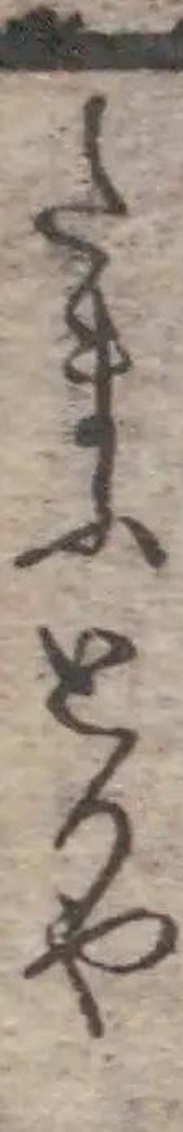たまふとかや

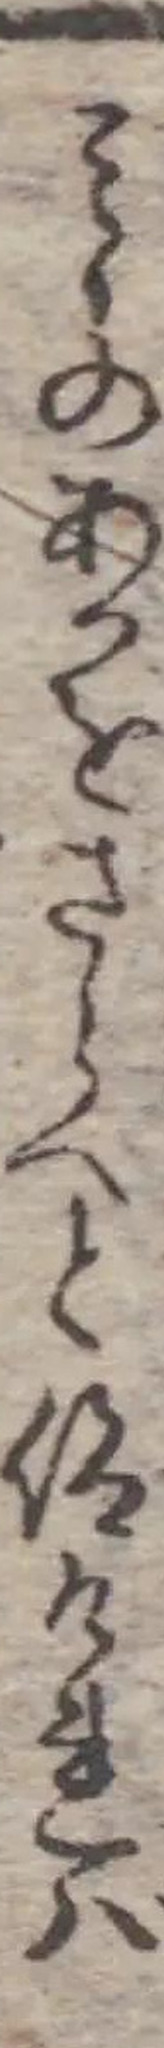みゝのあかをさらへと仰ければ
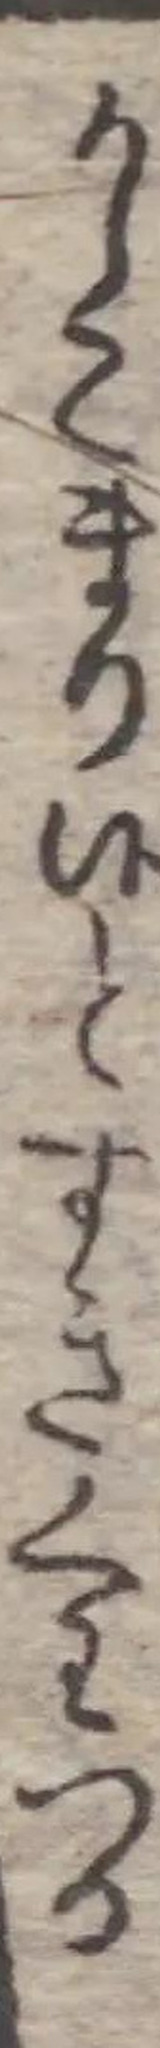かしこまり候とすきくわつる
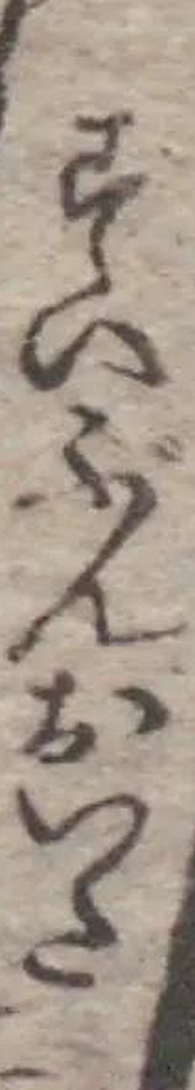すいぶんおいた
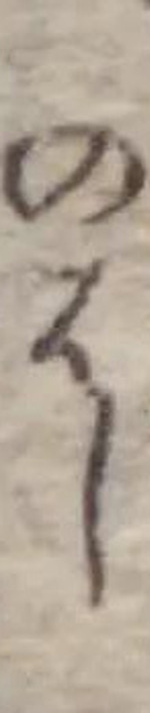のはし
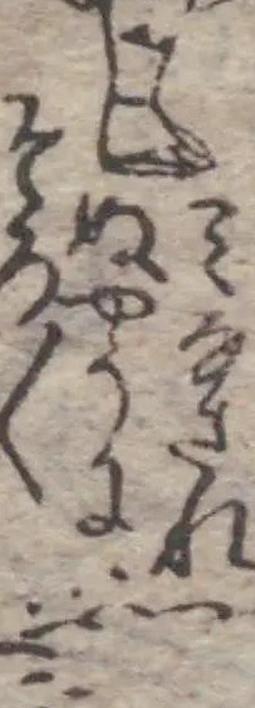そろ〳〵
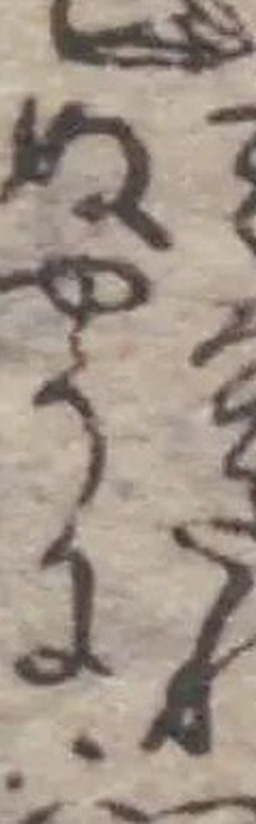ぬやうに
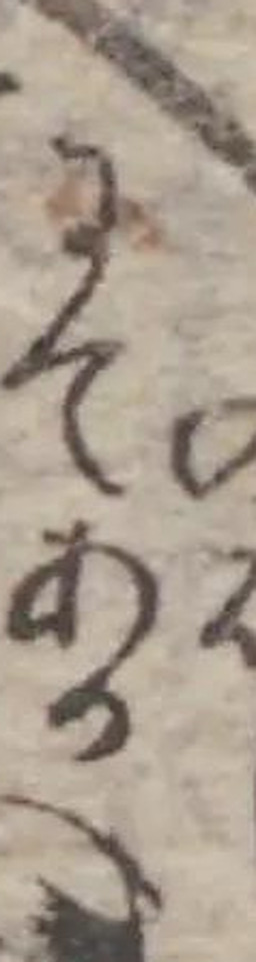にてあか
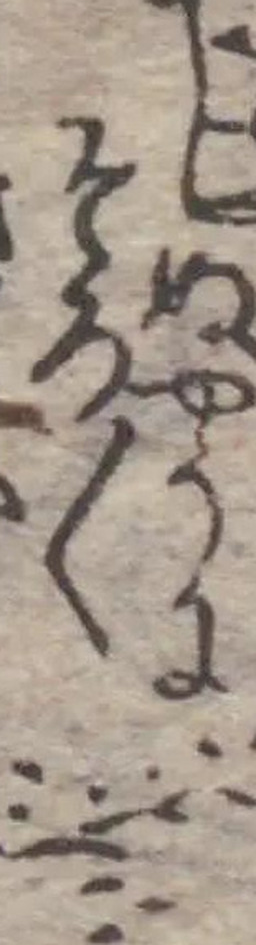そろ〳〵
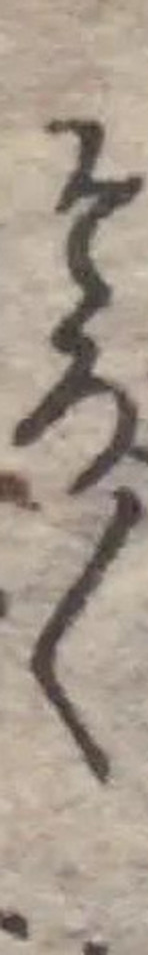そろ〳〵
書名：五たいそう
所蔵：国立国会図書館 National Diet Library, JAPAN
